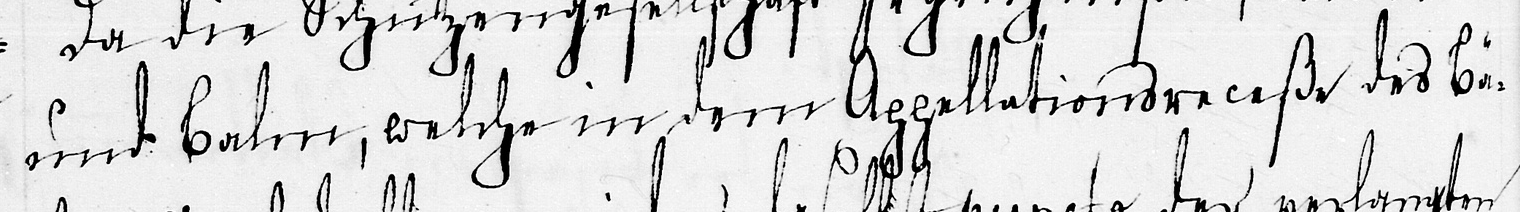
und Balm, welche in dem Appellationsracaße des Bä¬
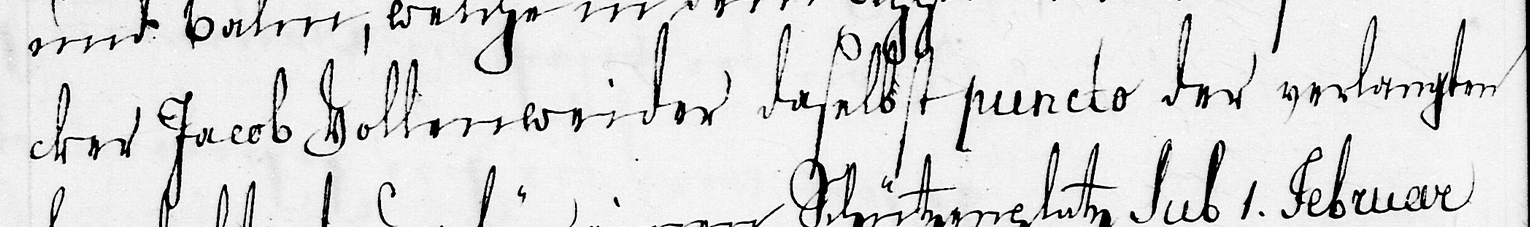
cker Jacob Vollenweider daselbst puncto der verlangten
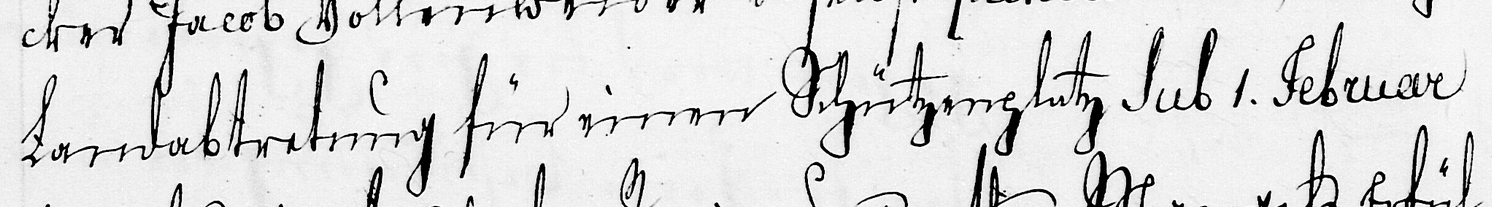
Landabtretung für einen Schützenplatz sub 1. Februar
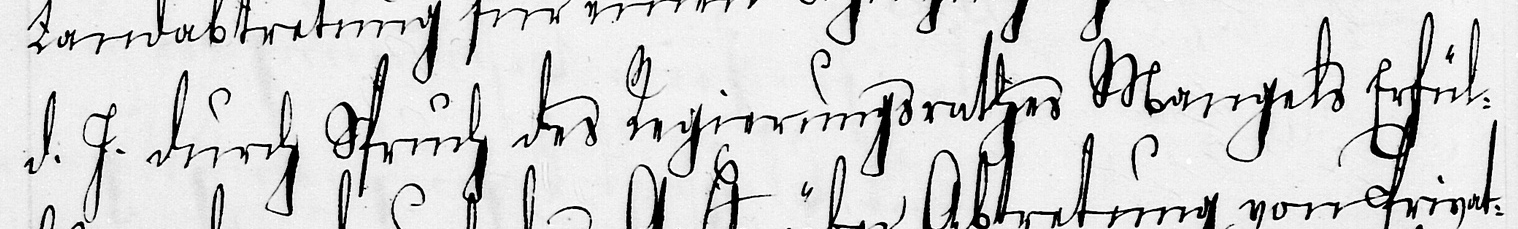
d. J. durch Spruch des Regierungsrathes Mangels Erfül¬
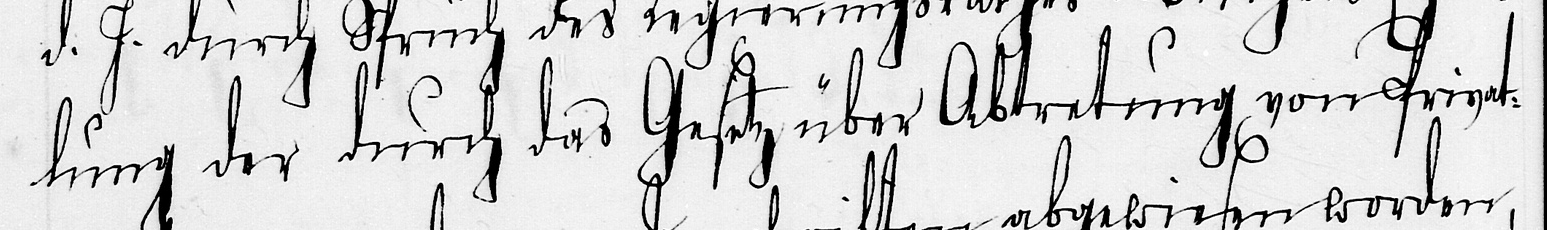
lung der durch das Gesetz über Abtretung von Priva¬
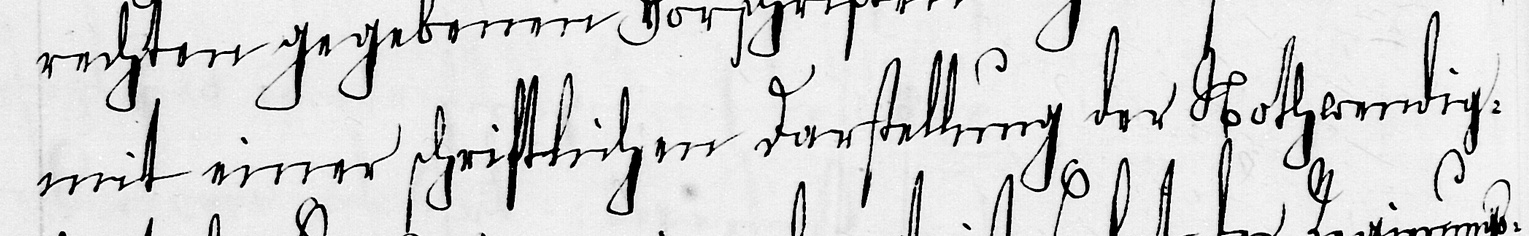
mit einer schriftlichen Darstellung der Nothwendig¬
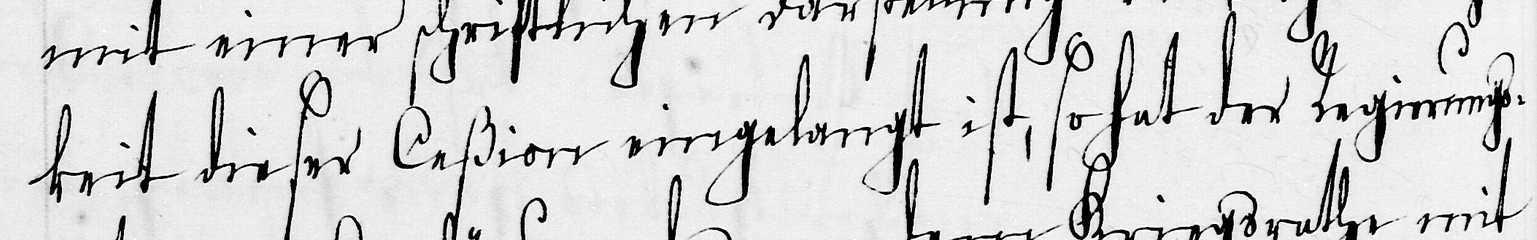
keit dieser Ceßion eingelangt ist, so hat der Regieru¬
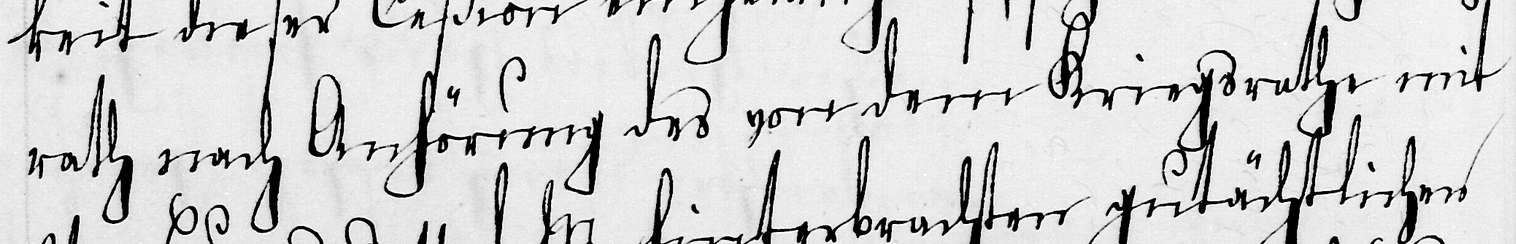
rath nach Anhörung des von dem Kriegsrathe mit
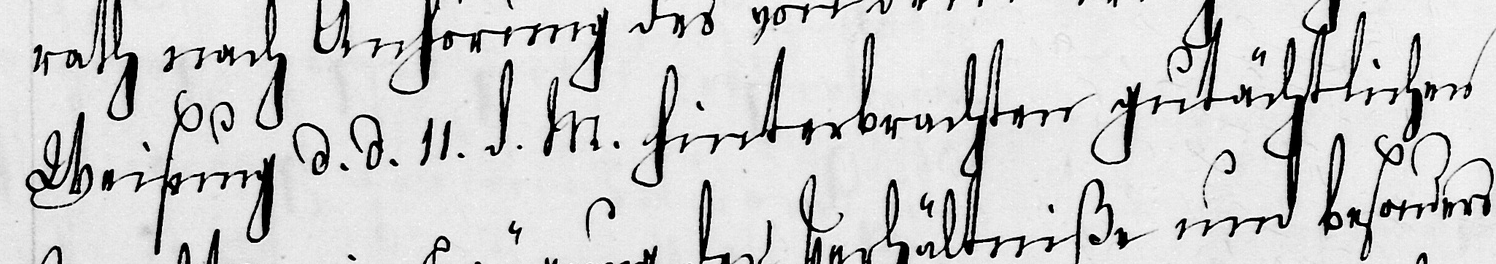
Weisung d. d. 11. d. M. hinterbrachten gutächtlichen
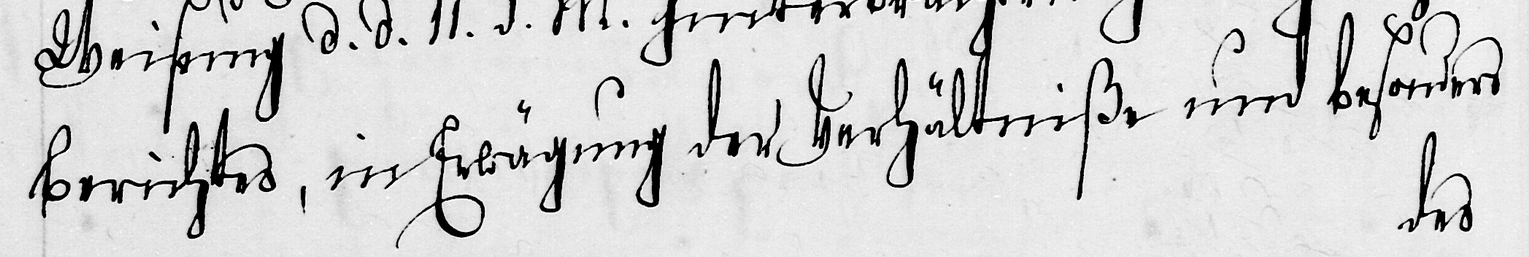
Berichtes, in Erwägung der Verhältniße und besonders
